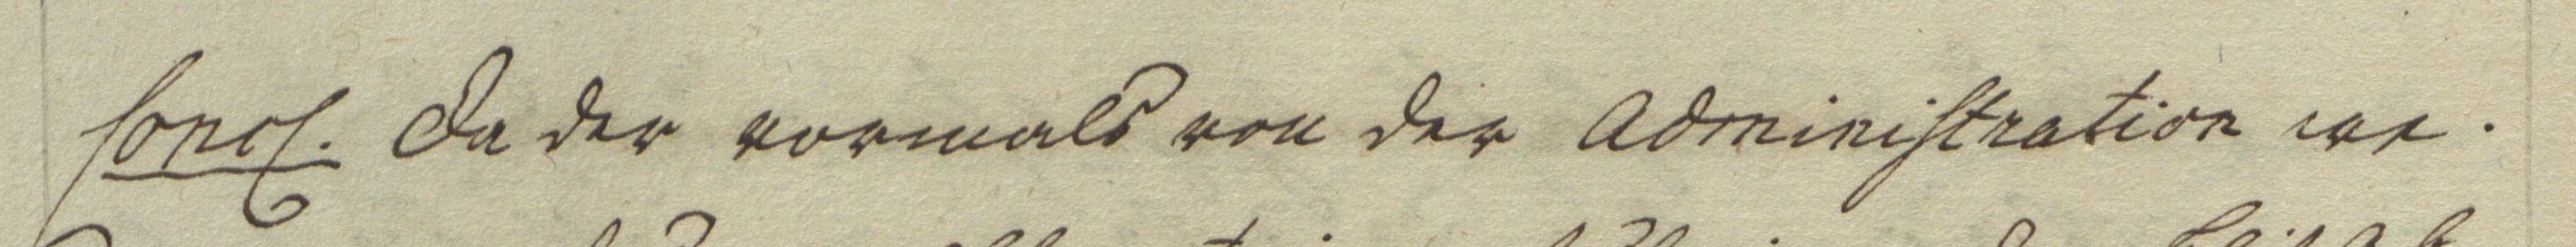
Concl. Da der vormals von der Administration we¬
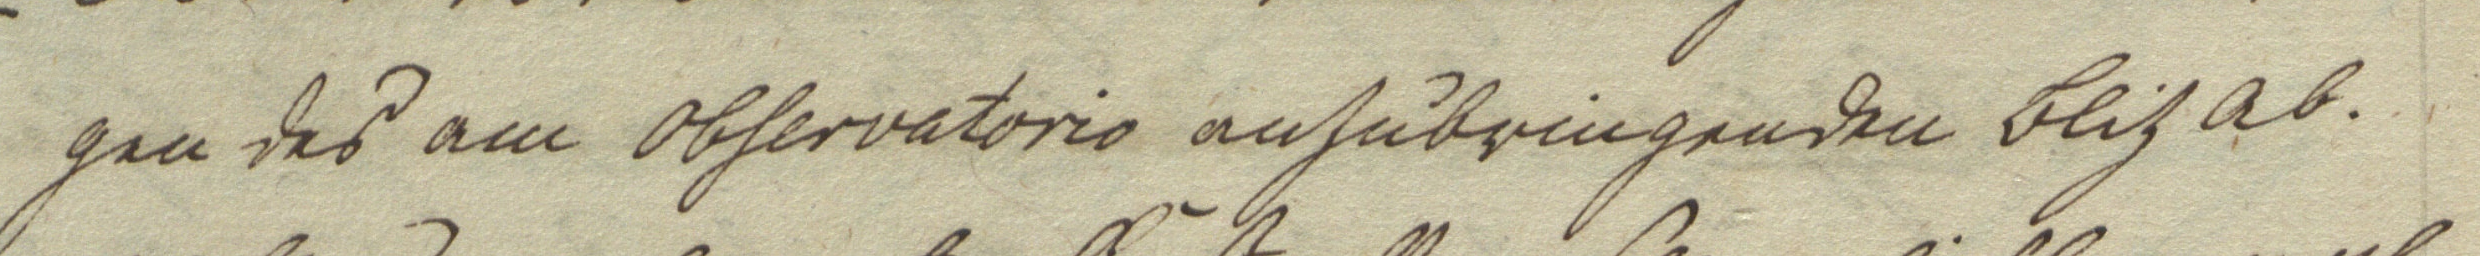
gen des am Observatorio anzubringenden Blizab-
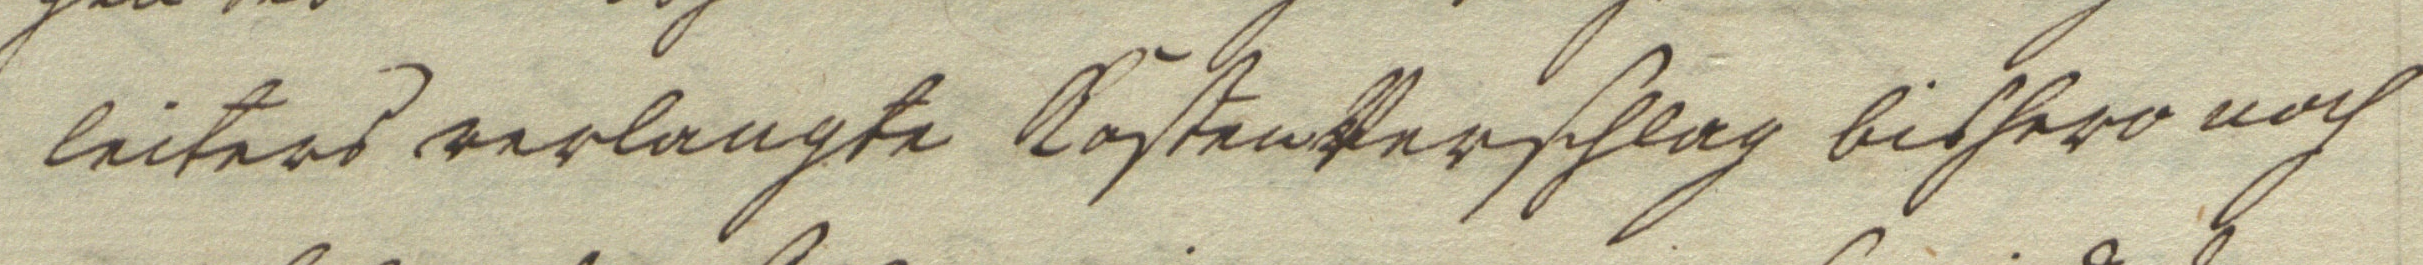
leiters verlangte Kostenverschlag bishero noch
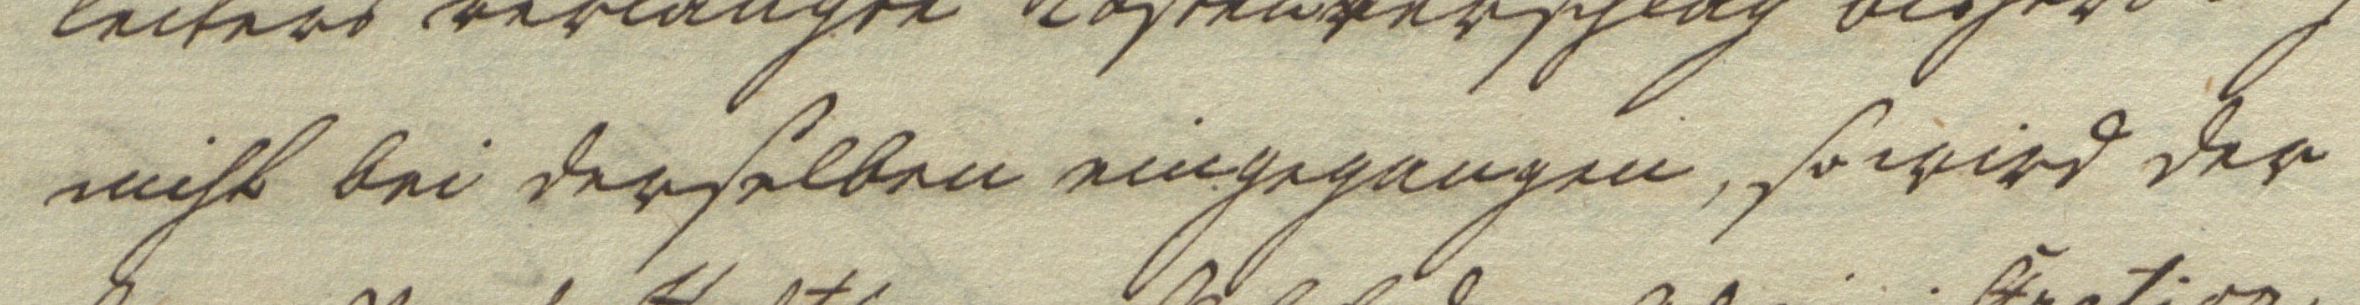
nicht bei derselben eingegangen, so wird der
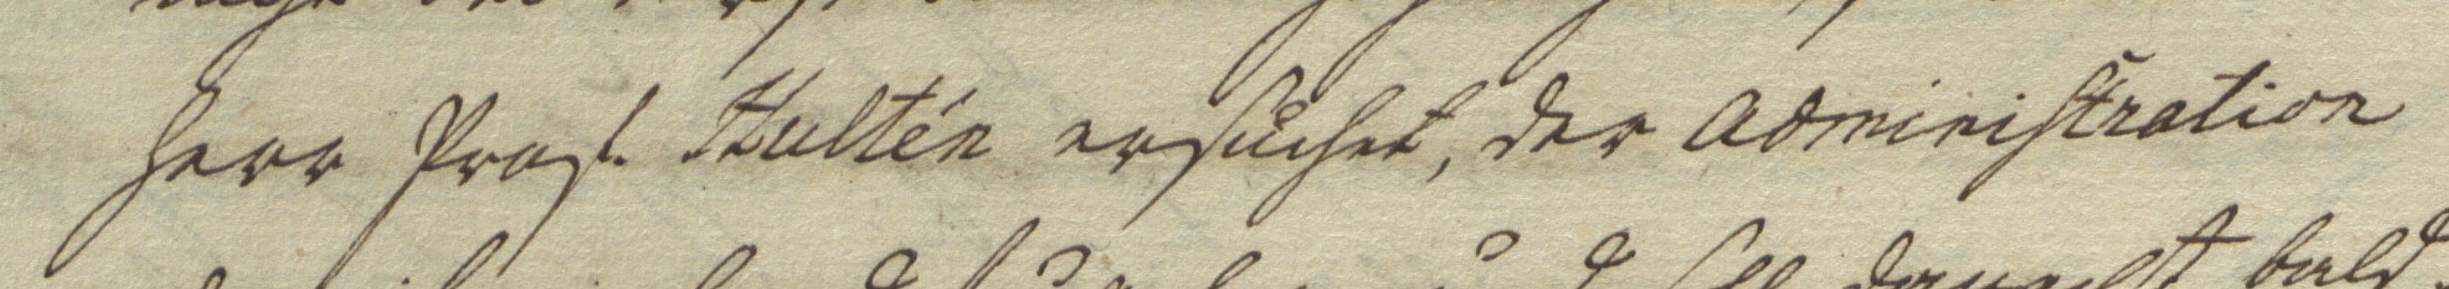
Herr Prof. Hultén ersuchet, der Administration
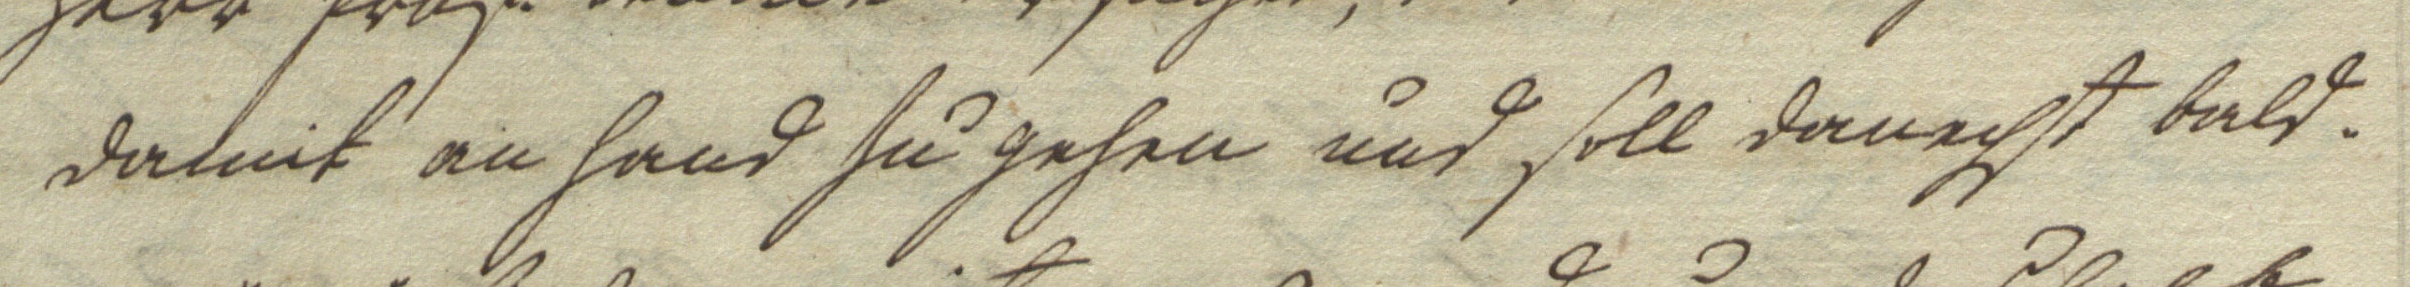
damit an Hand zu gehen und soll danechst bald¬
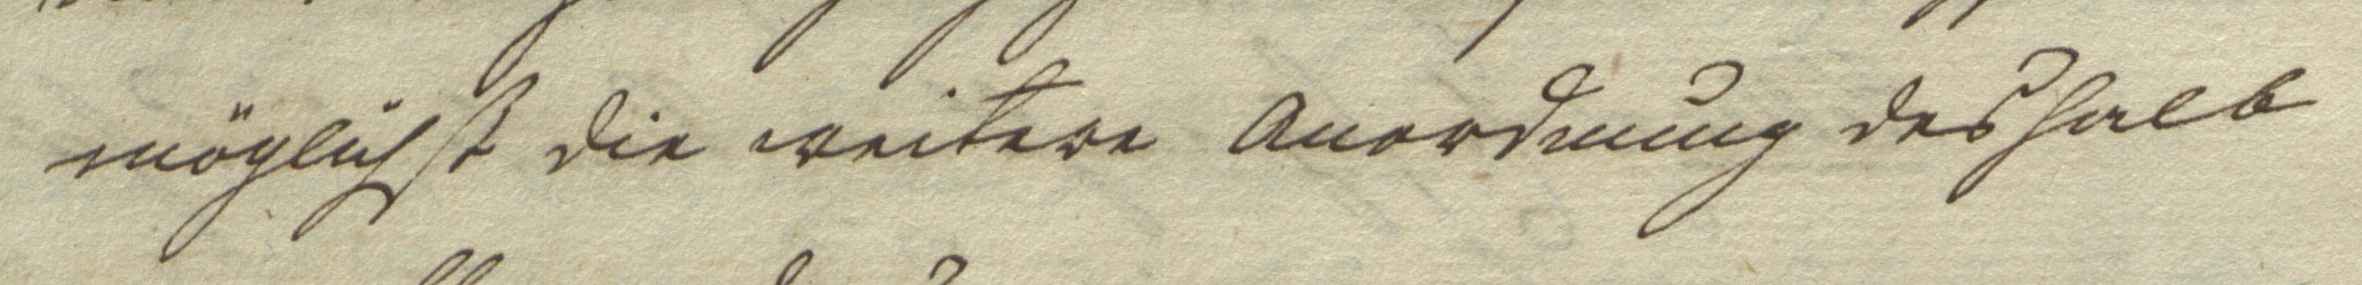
möglichst die weitere Anordnung deshalb
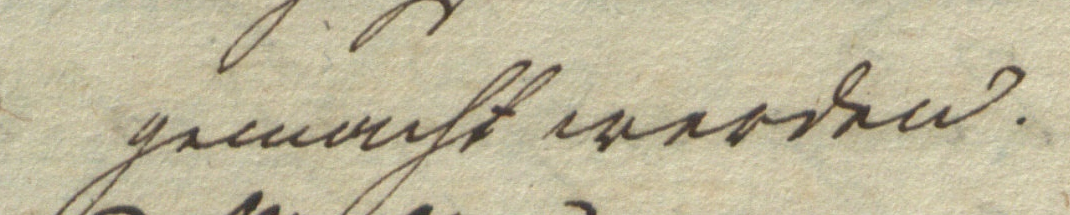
gemacht werden.
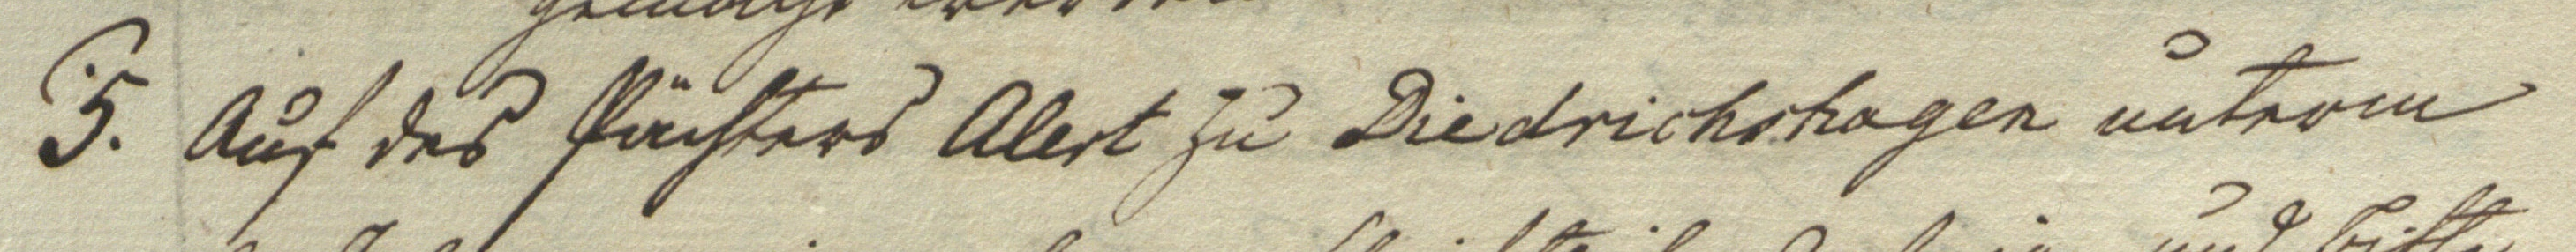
5. Auf des Pächters Alert zu Diedrichshagen unterm
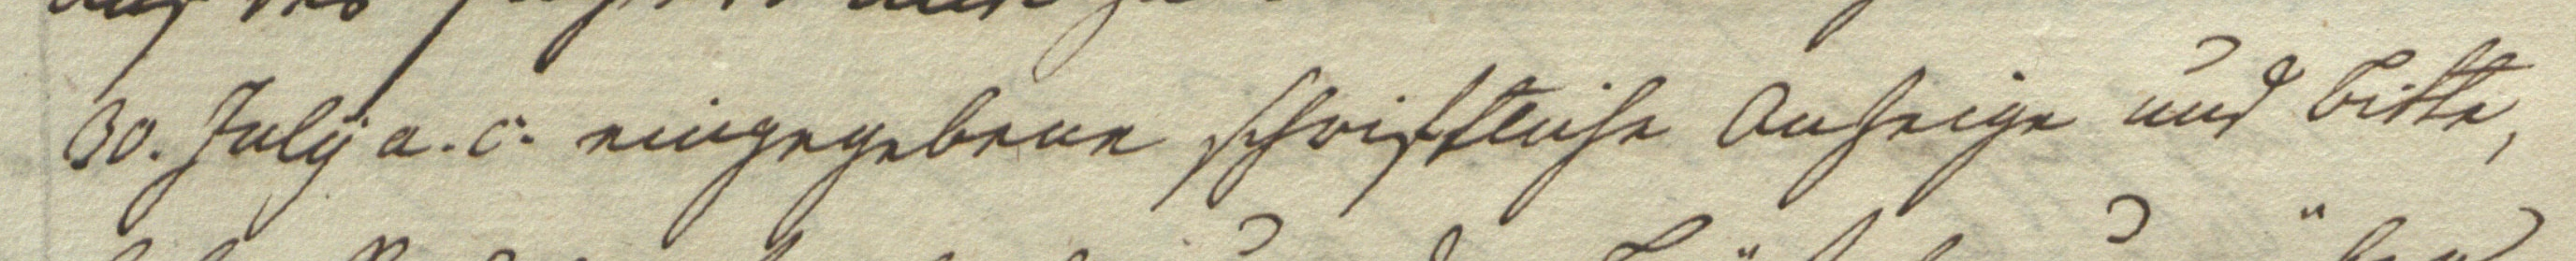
30. Julÿ a. c. eingegebene schriftliche Anzeige und Bitte,
